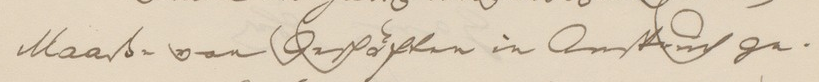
Maaße von Geschäften in Anspruch ge-
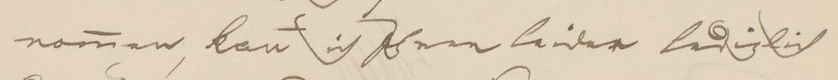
nommen, kann ich Ihnen leider lediglich
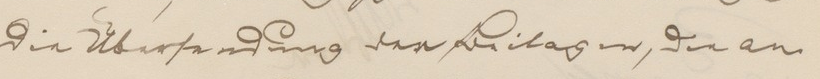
die Übersendung der Beilagen, die an-
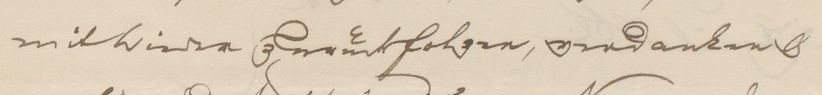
mit wieder zurückfolgen, verdanken &
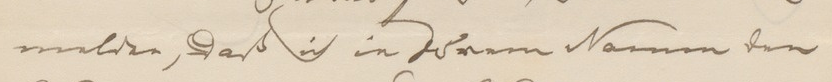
melden, daß ich in Ihrem Namen den
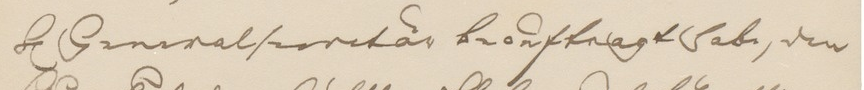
Hrn Generalsecretär beauftragt habe, den
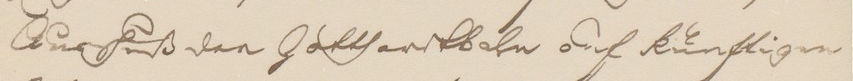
Ausschuß der Gotthardtbahn auf künftigen
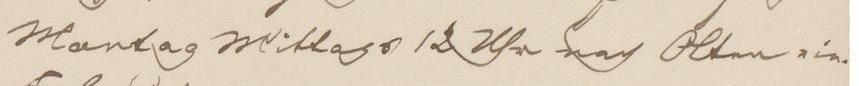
Montag Mittags 12 Uhr nach Olten ein-
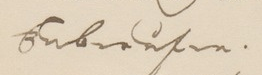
zuberufen.
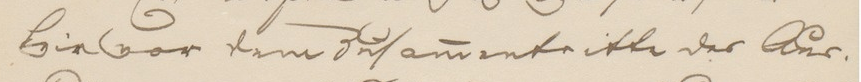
wir vor dem Zusammentritte des Aus-
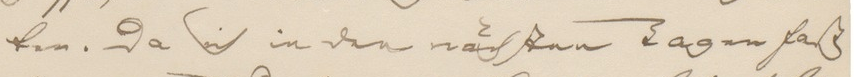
ten. Da ich in den nächsten Tagen fast
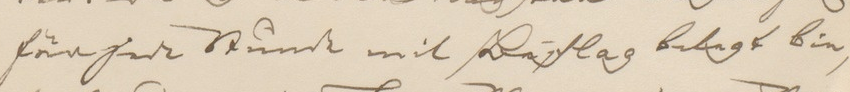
für jede Stunde mit Beschlag belegt bin,
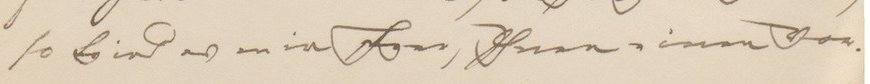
so wird es mir schwer, Ihnen einen Vor-
